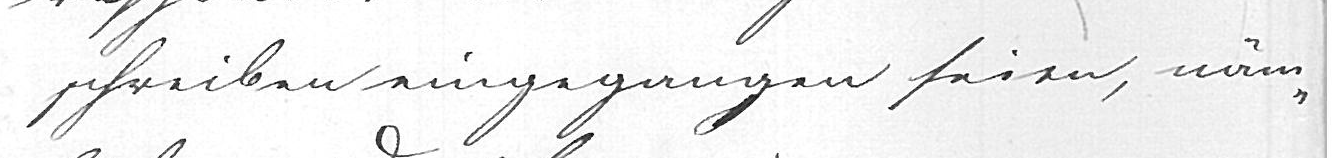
schreiben eingegangen seien, näm-
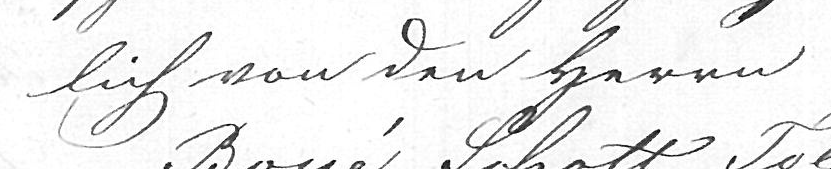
lich von den Herrn
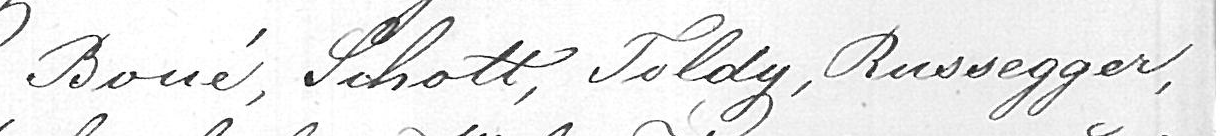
Boué, Schott, Toldy, Russegger,
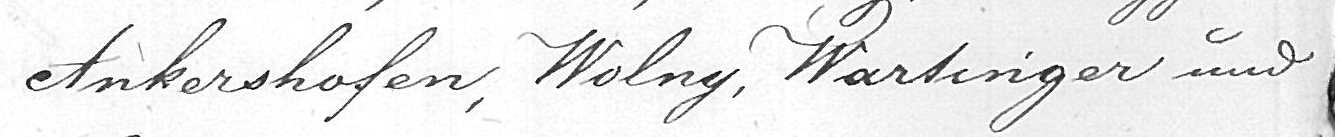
Ankershofen, Wolny, Wartinger und
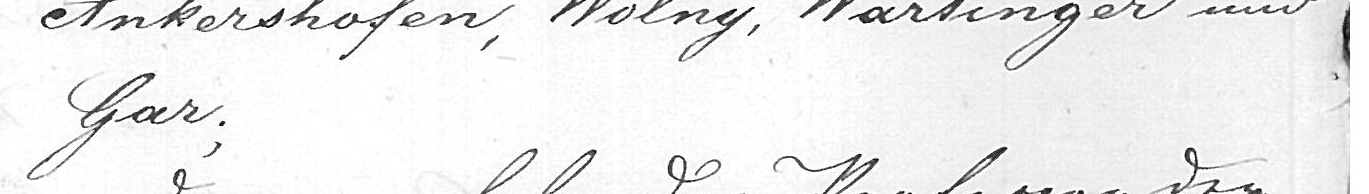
Gar;
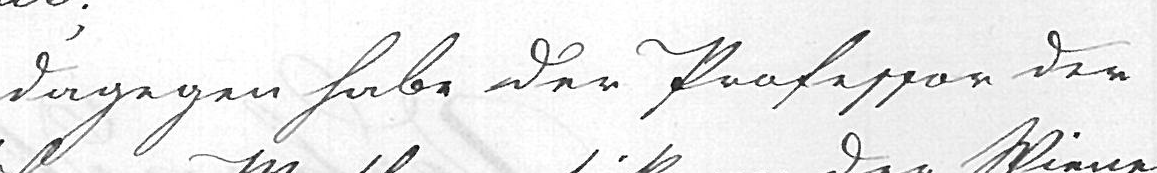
dagegen habe der Professor der
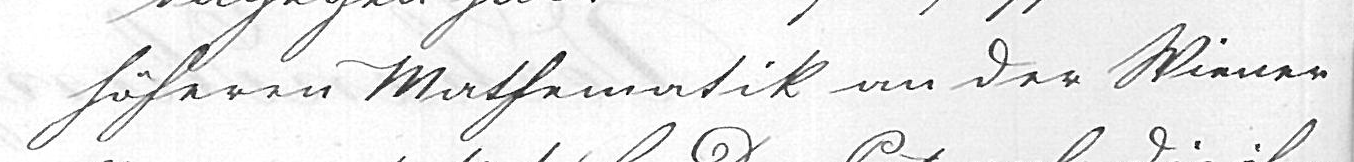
höheren Mathematik an der Wiener
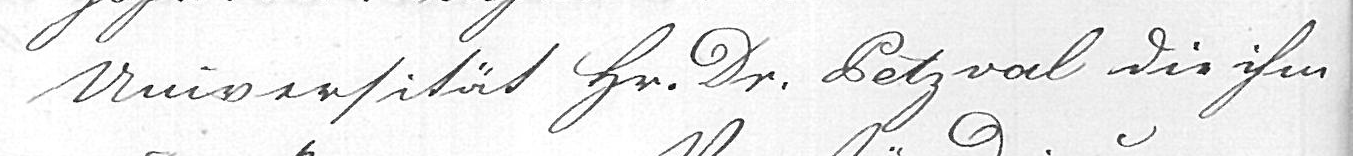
Universität Hr. Dr. Petzval die ihm
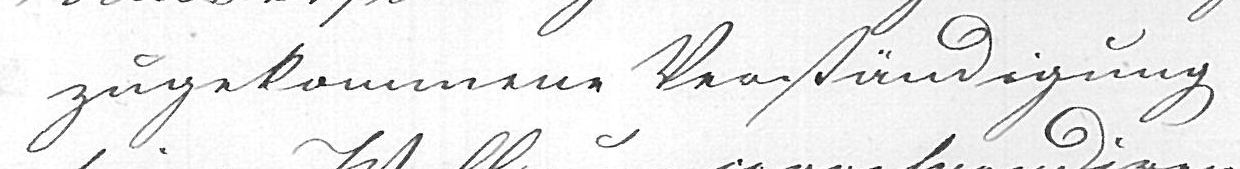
zugekommene Verständigung
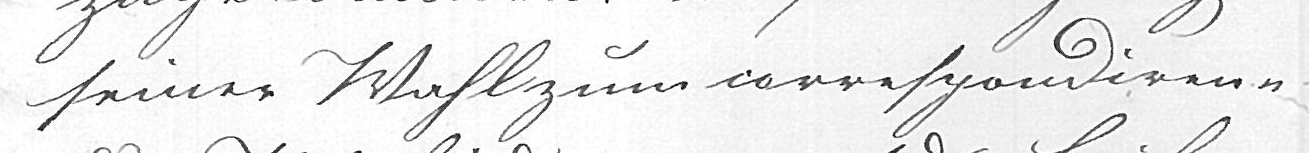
seiner Wahl zum correspondiren-
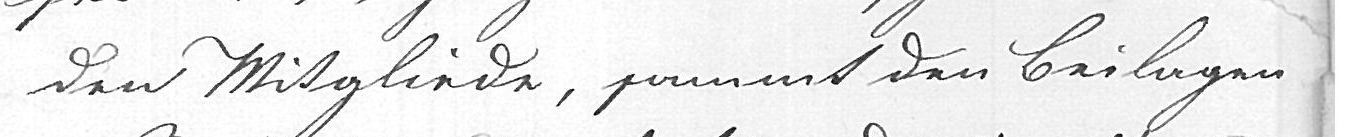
den Mitgliede, sammt den Beilagen
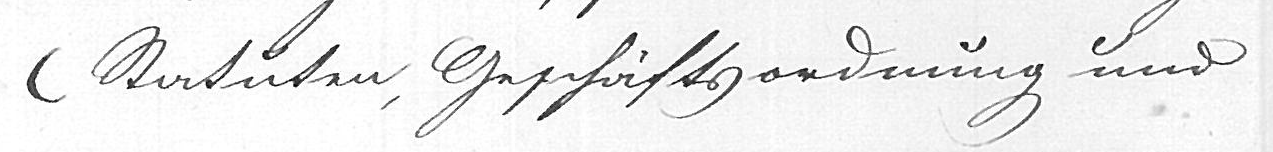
(Statuten, Geschäftsordnung und
